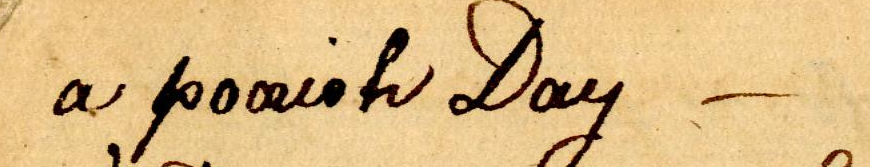a poorish Day--
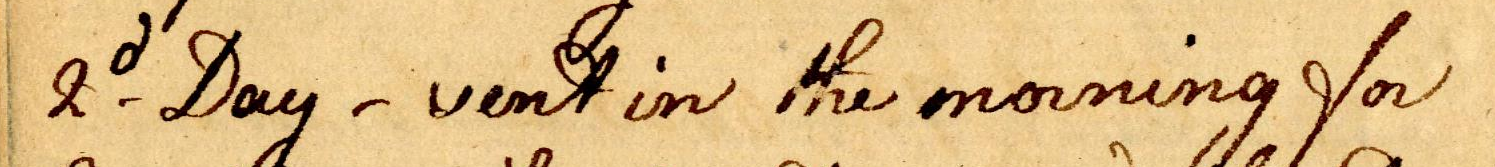2^d. Day- sent in the morning for
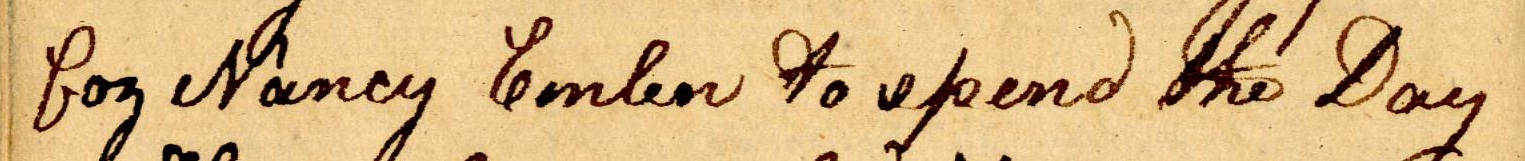Coz Nancy Emlen to spend the Day
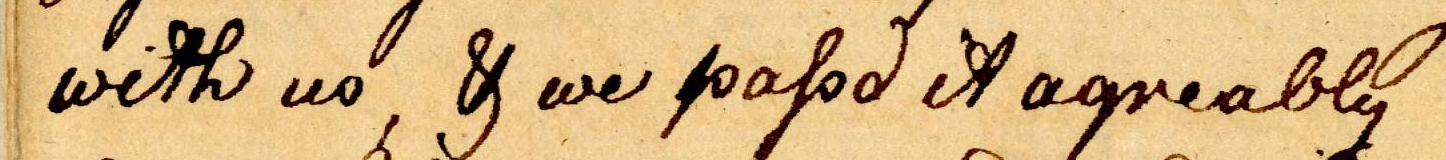with us, & we passd it agreably
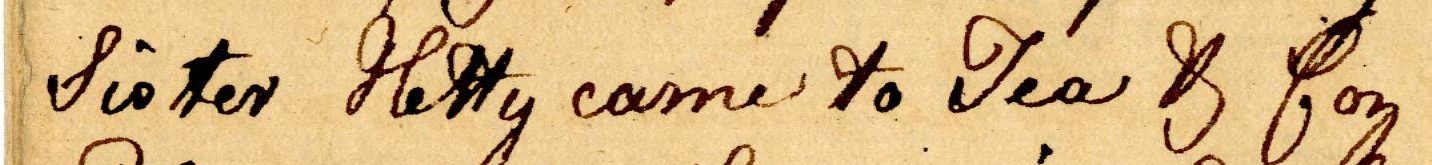Sister Hetty came to Tea & Coz
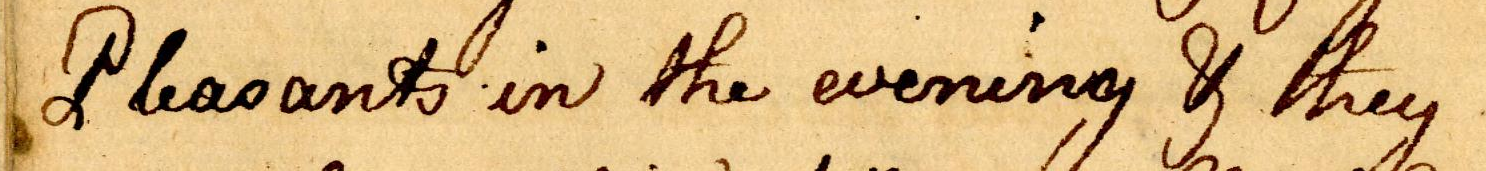Pleasants in the evening & they
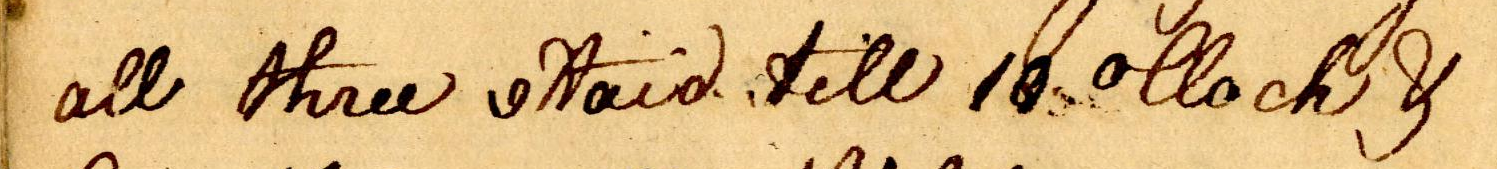all three staid till 18 ^oClock &
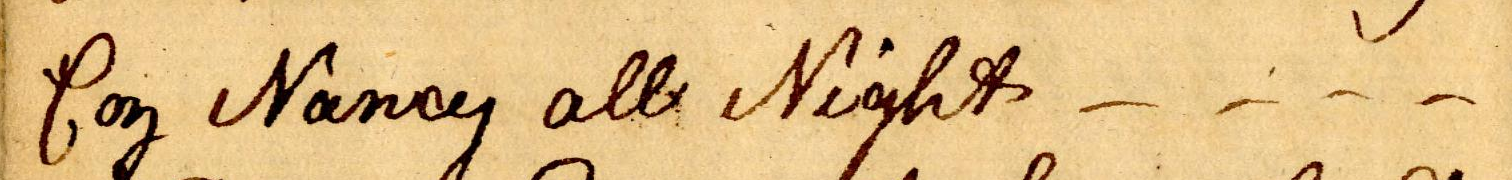Coz Nancy all Nights-
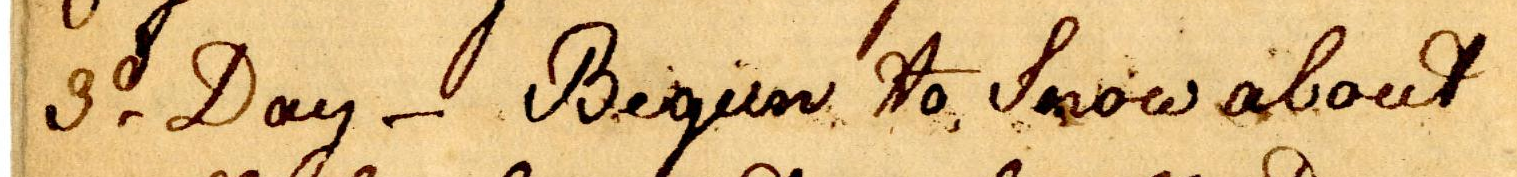3^th. Day- Begun to Snow about
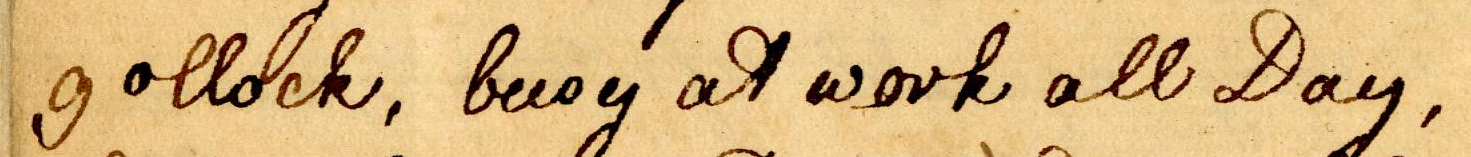9 ^oClock, busy at work all Day,
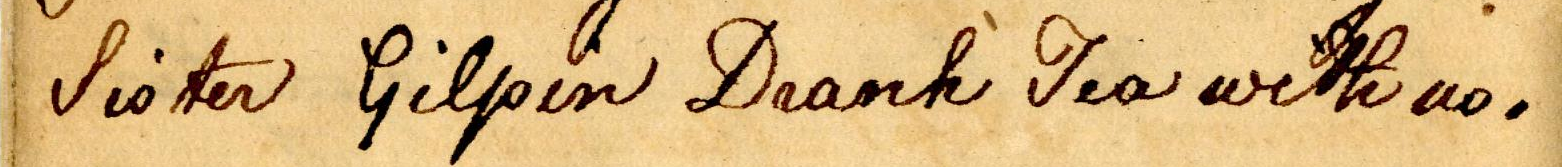Sister Gilpin Drank Tea with us-
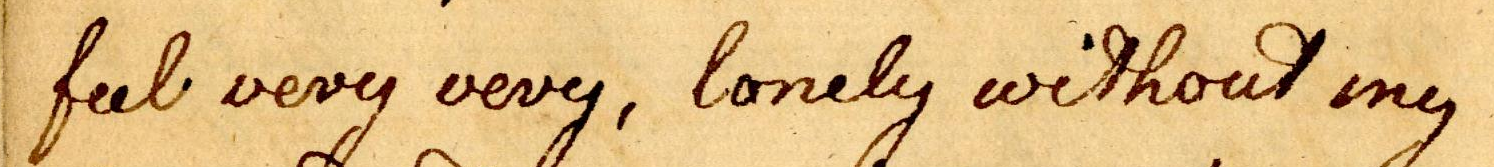feel very very, lonely without my
